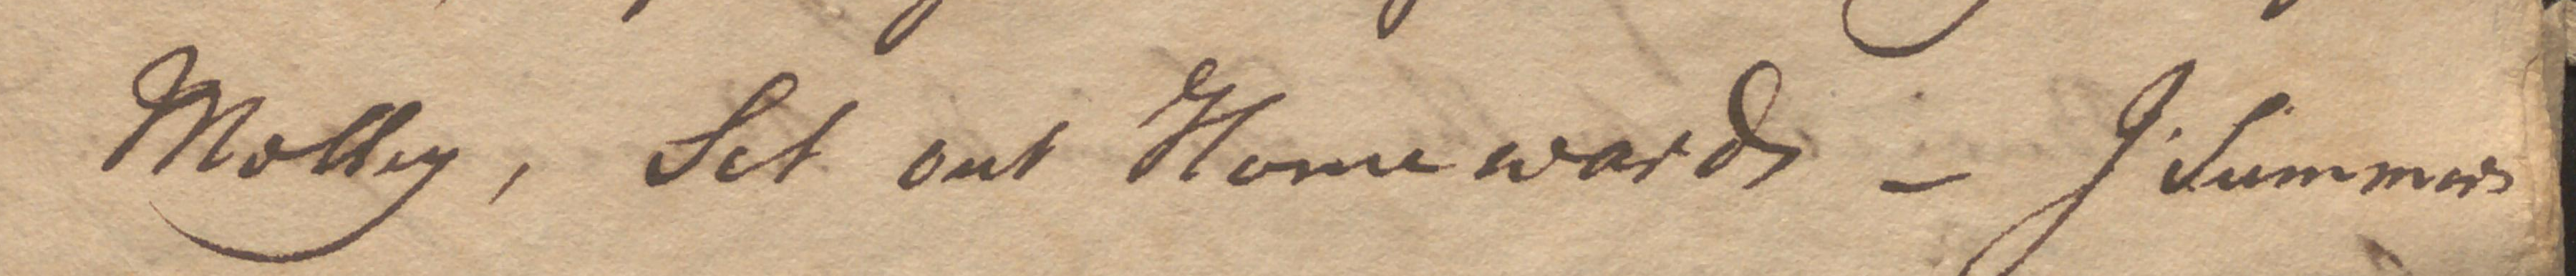Molley, Set out Homewards- J Summers
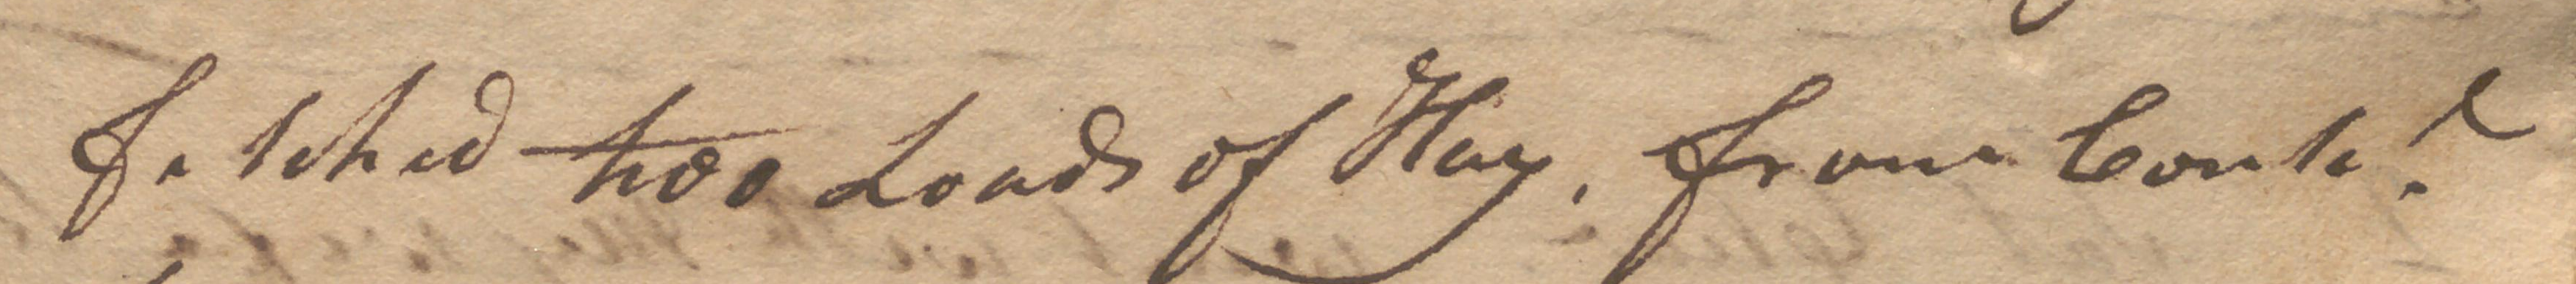fetched 400 Loads of Hay. from Cont^l.
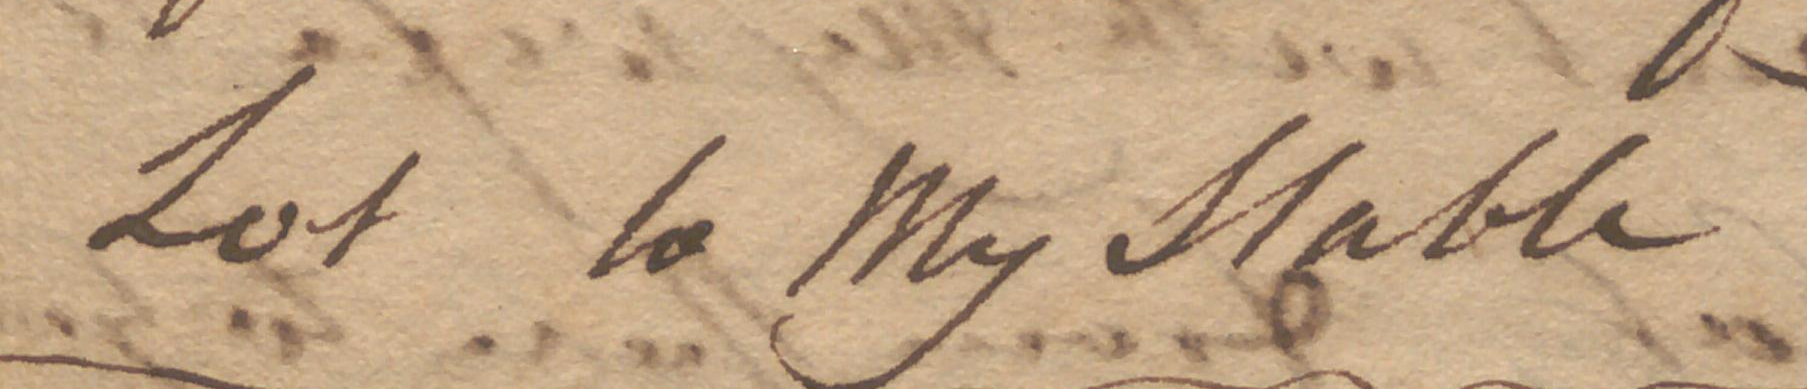Lot to My Stable
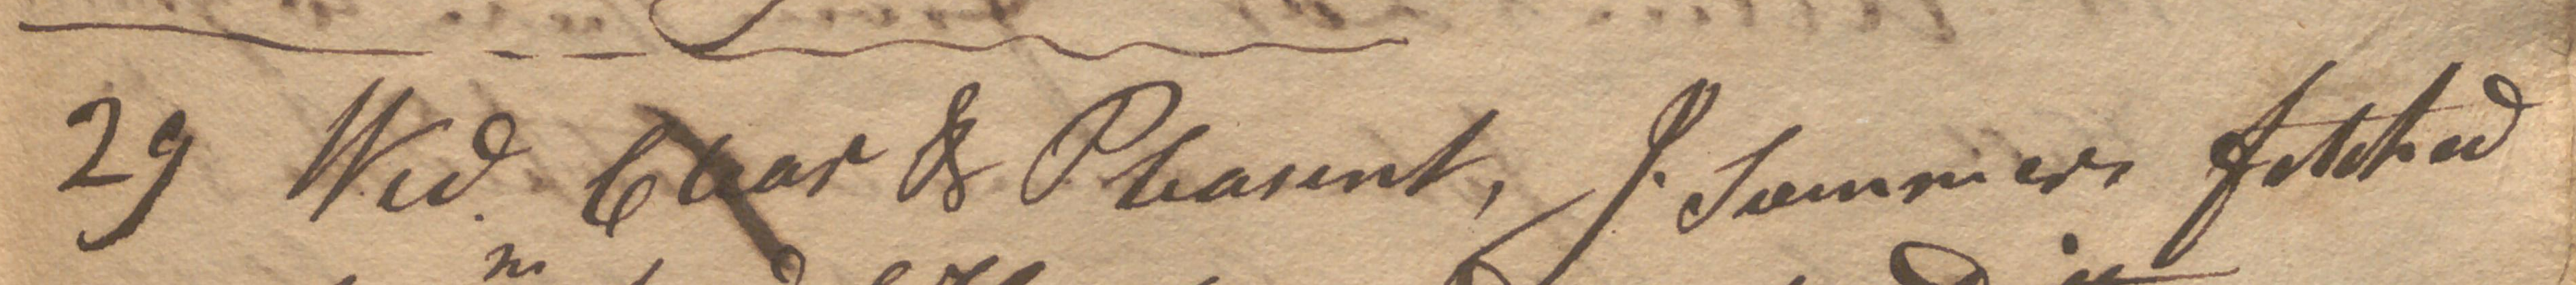29 We^d. Clear & Pleasent, J Summers fetched
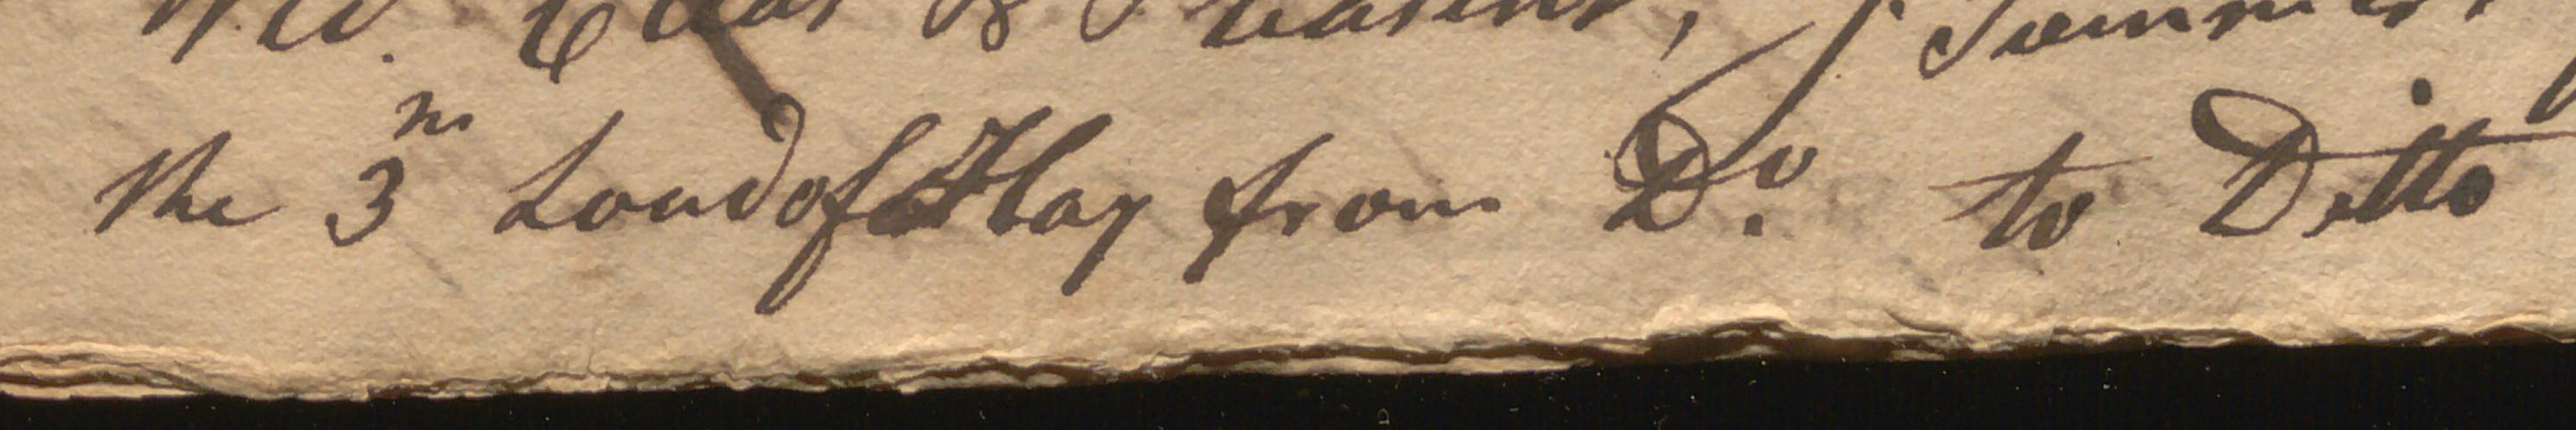the 3^th Loud of Hay fron D^o. to Ditto
